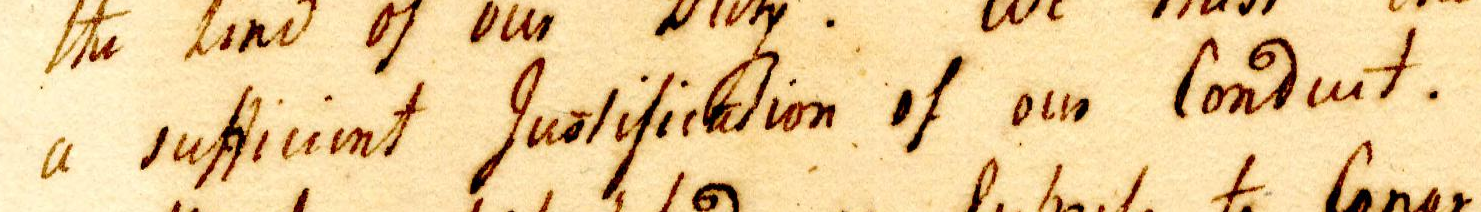a sufficient Justification of our Conduct.
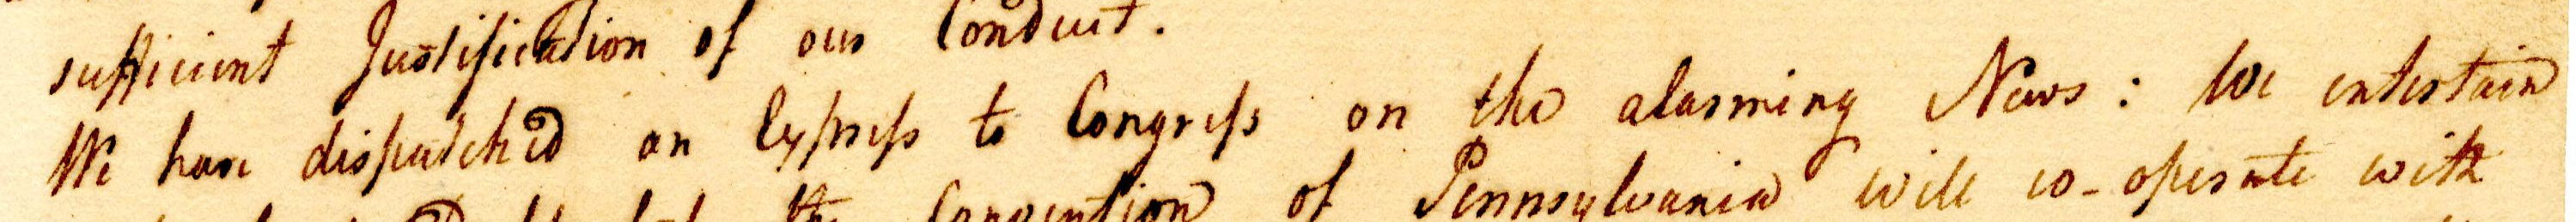We have dispatched on Express to Congress on the alarming News: We entertain
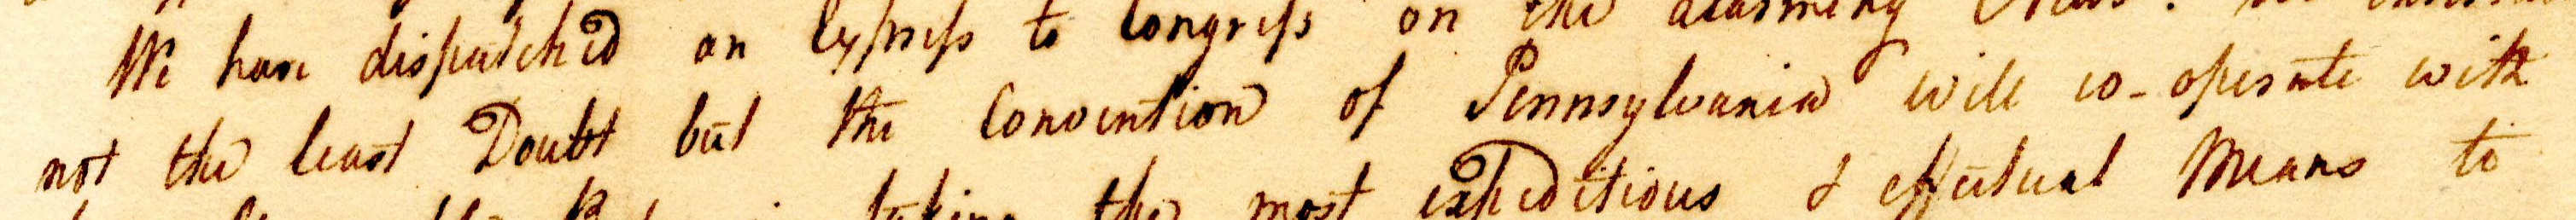not the least Doubt but the Convention of Pennsylvania will co-operate with
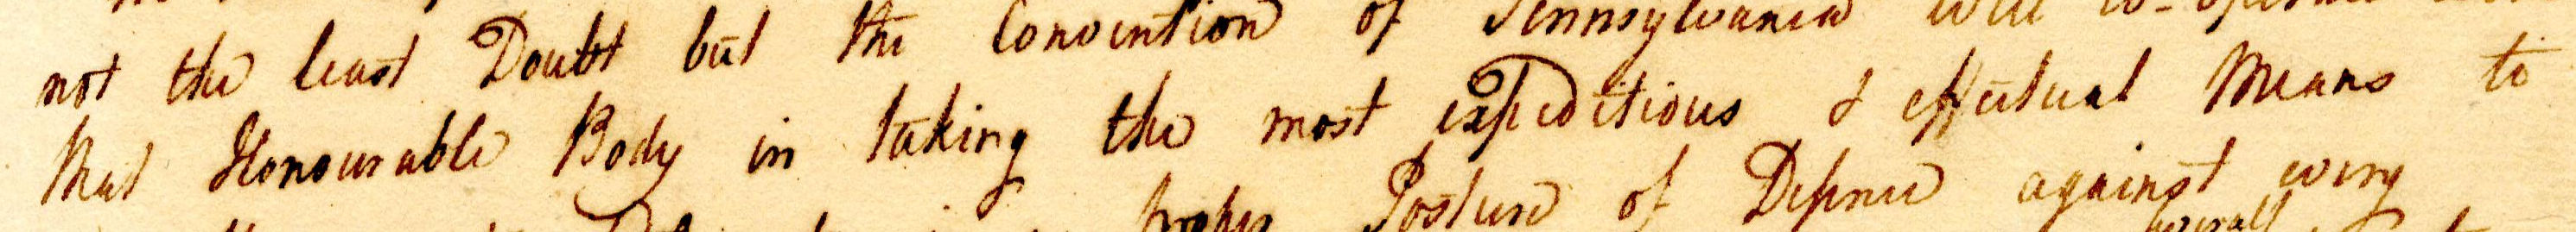that Honourable Body in taking the most expeditious & effectual Means to
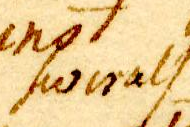several
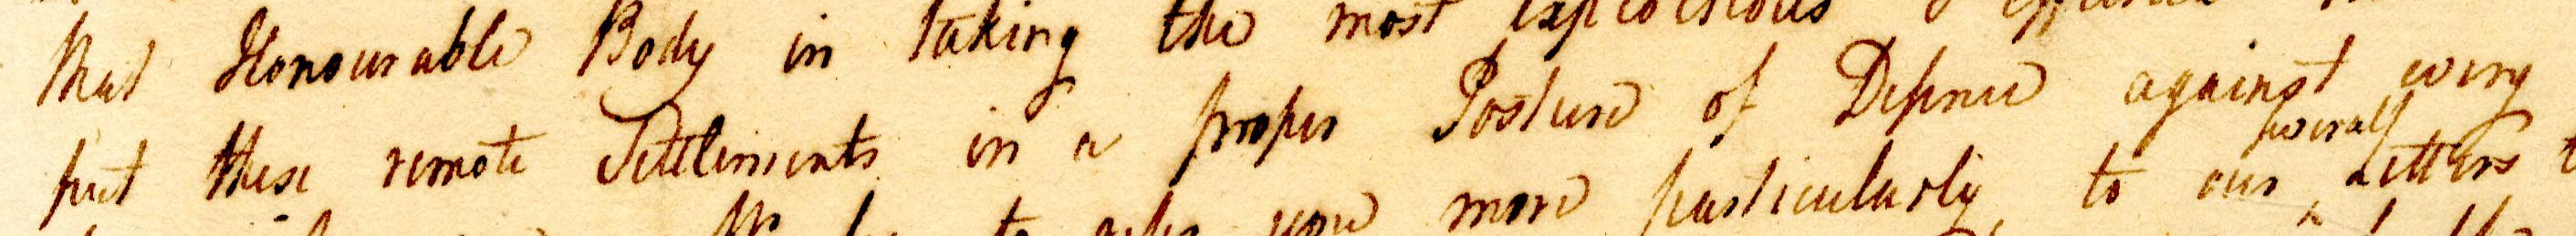put these remote Settlements in a proper Posture of Defence against every
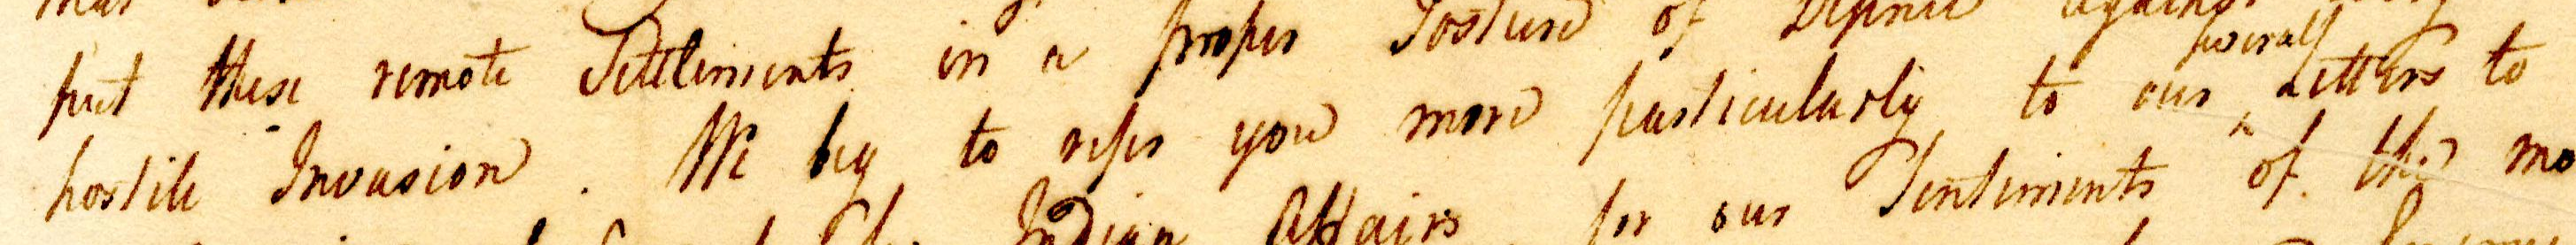hostile Invasion. We beg to refer you more particularly to our ^ Letters to
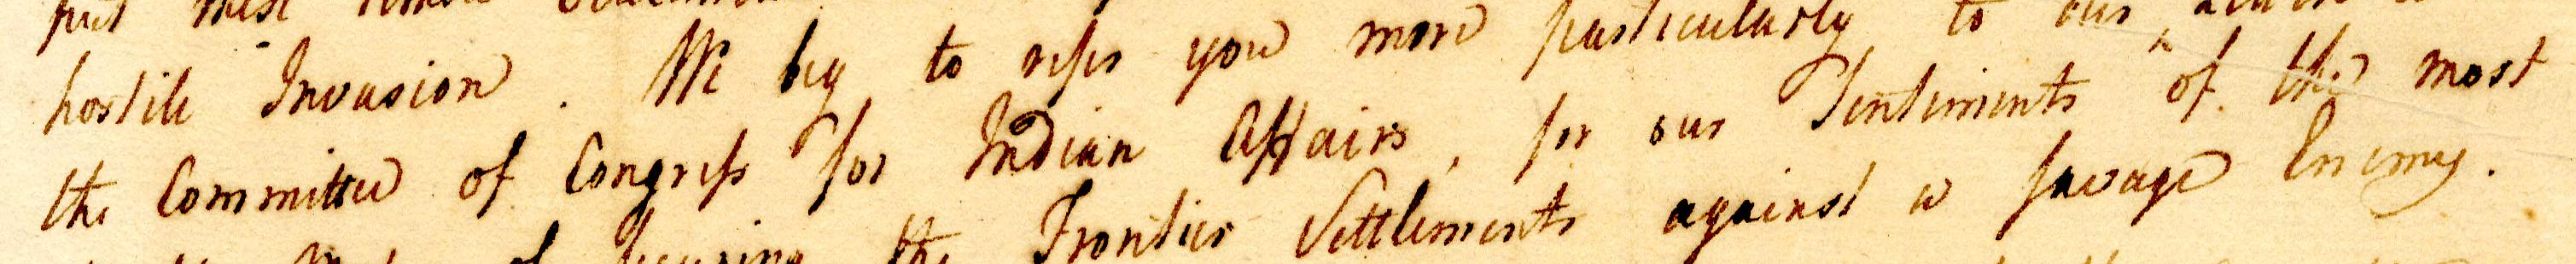the Committee of Congress for Indian Affairs, for our Sentiments of the most
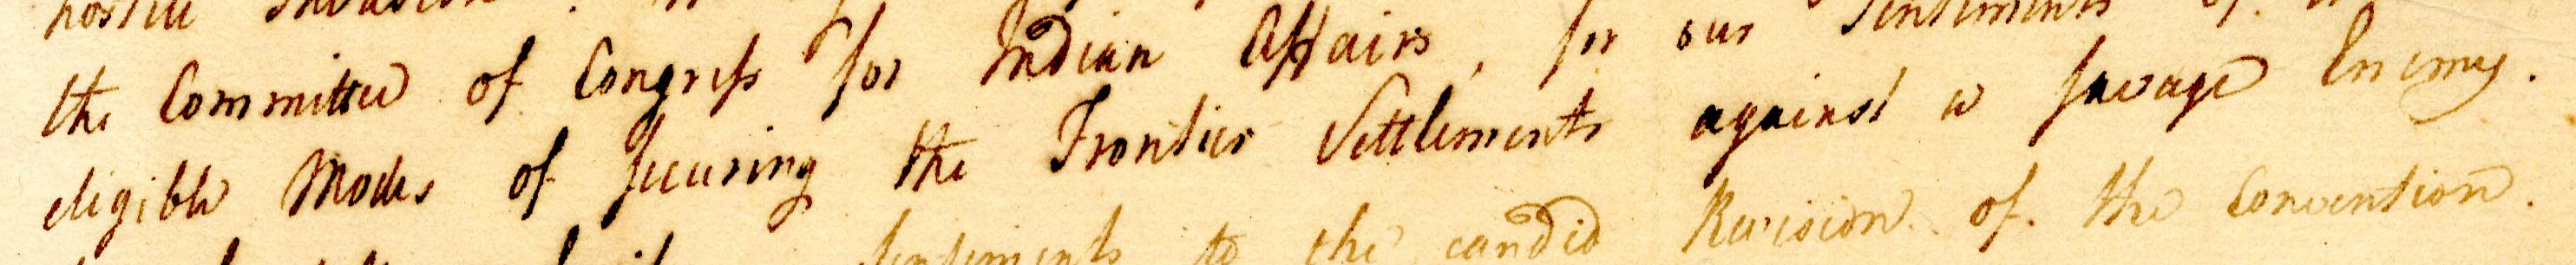eligible modes of securing the Frontier Settlements against a savage Enemy.
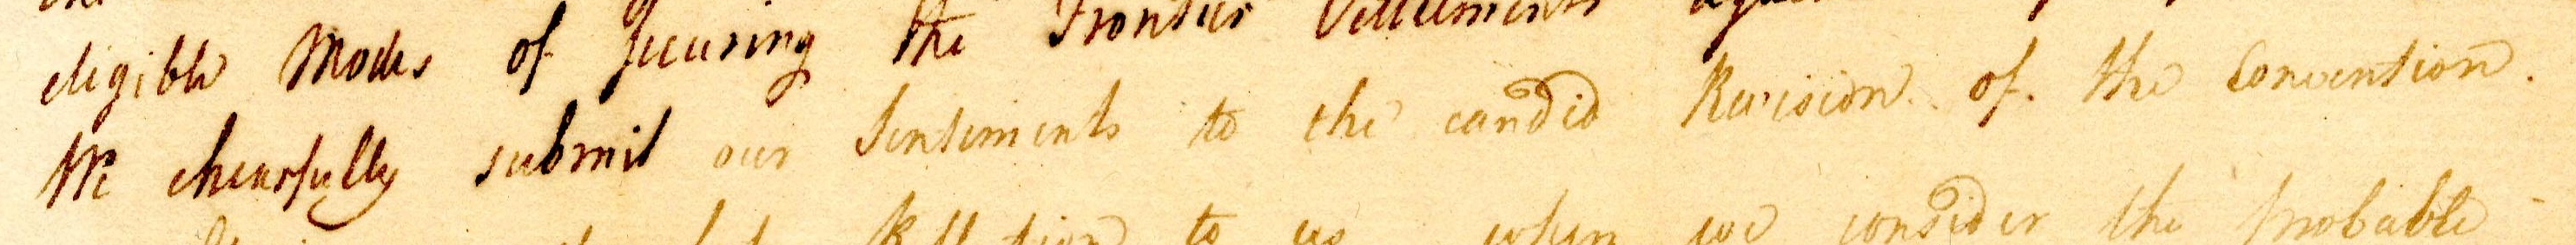We chearfully submit our Sentiments to the candid Revision of the Convention.
